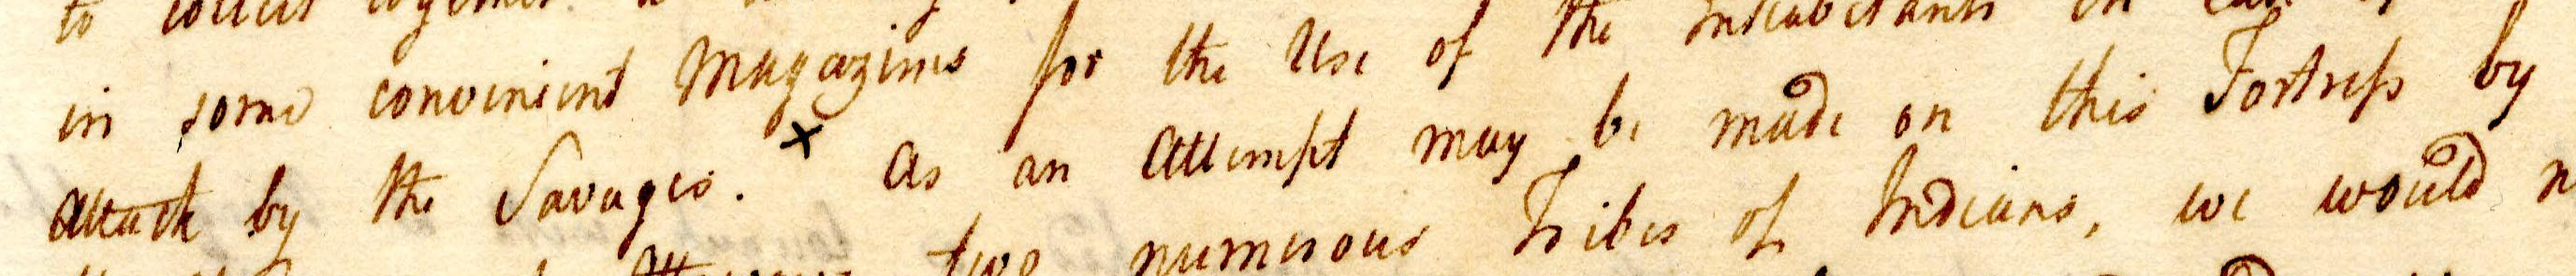attack by the Savages. As an attempt may be made on this Fortress by
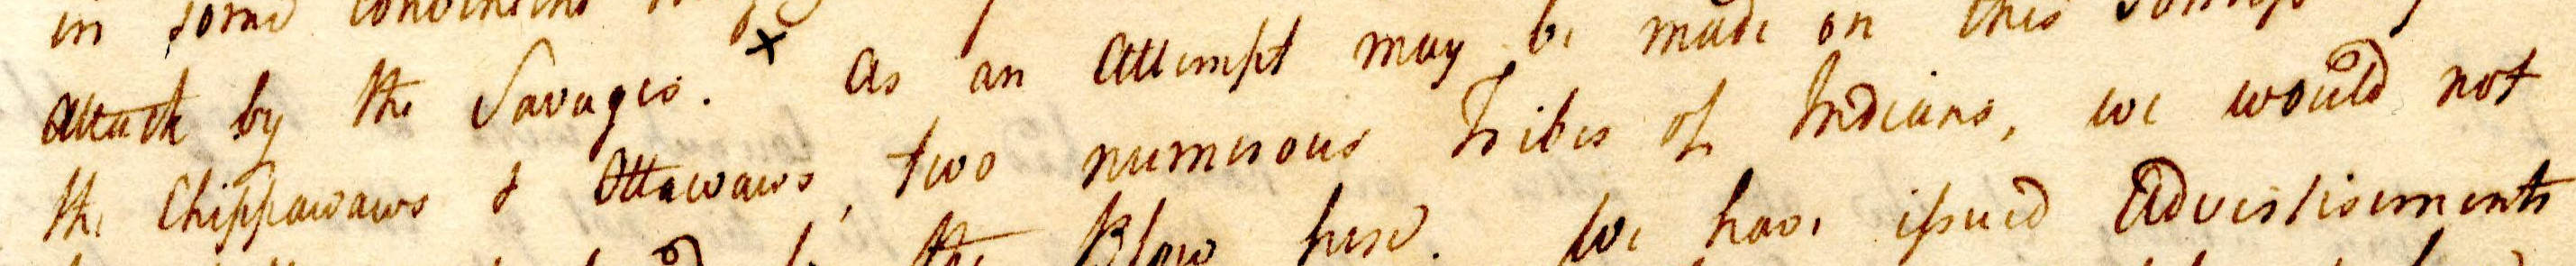the Chippawaws & Ottawaws, two numerous Tribes of Indians, we would not
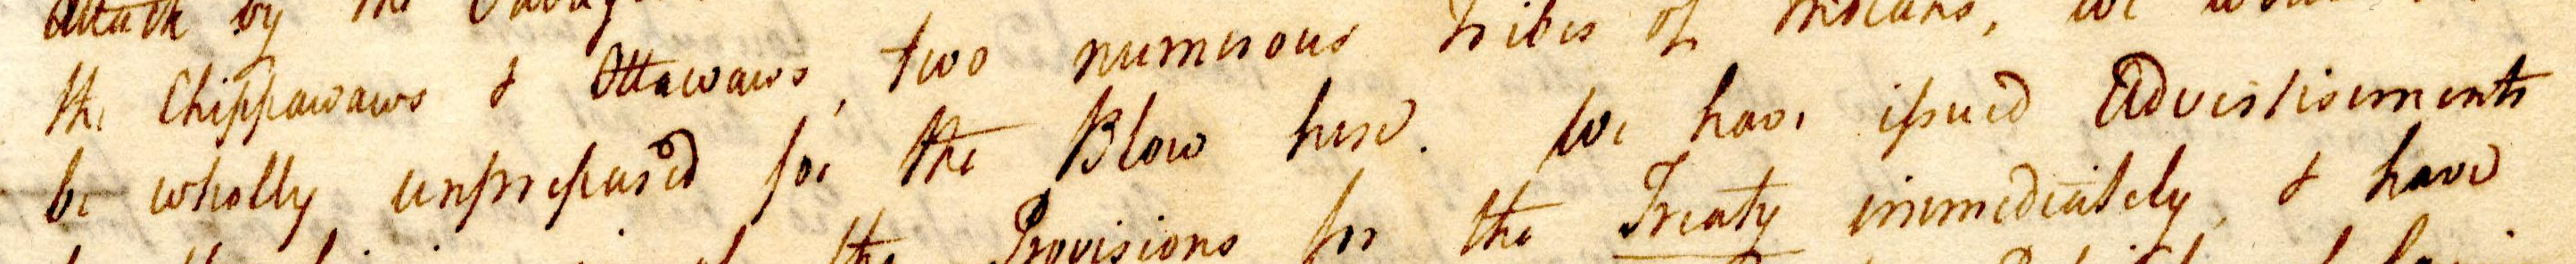be wholly unprepared for the Blow here. We have issued advertisements
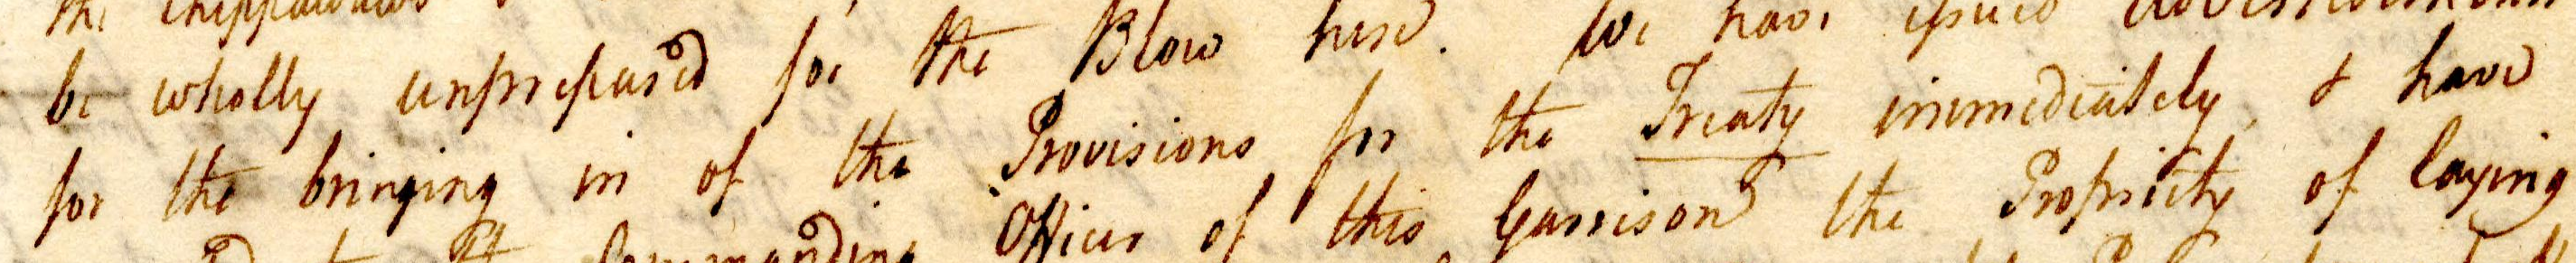for the bringing in of the Provisions for the Treaty immediately, & have
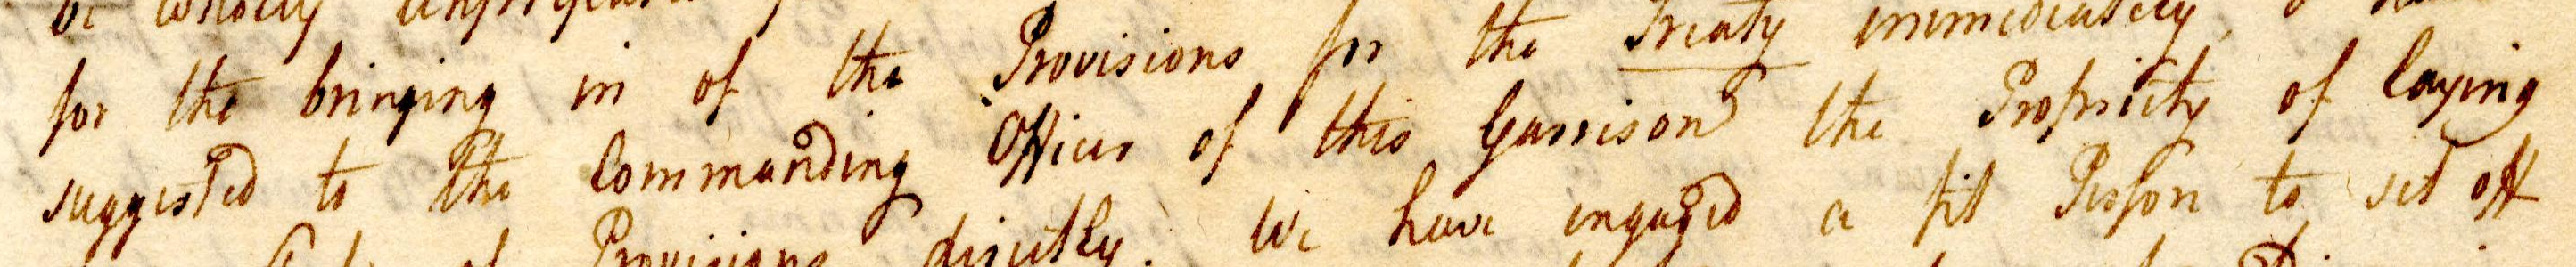suggested to the Commanding Officer of this Garrison the Propriety of laying
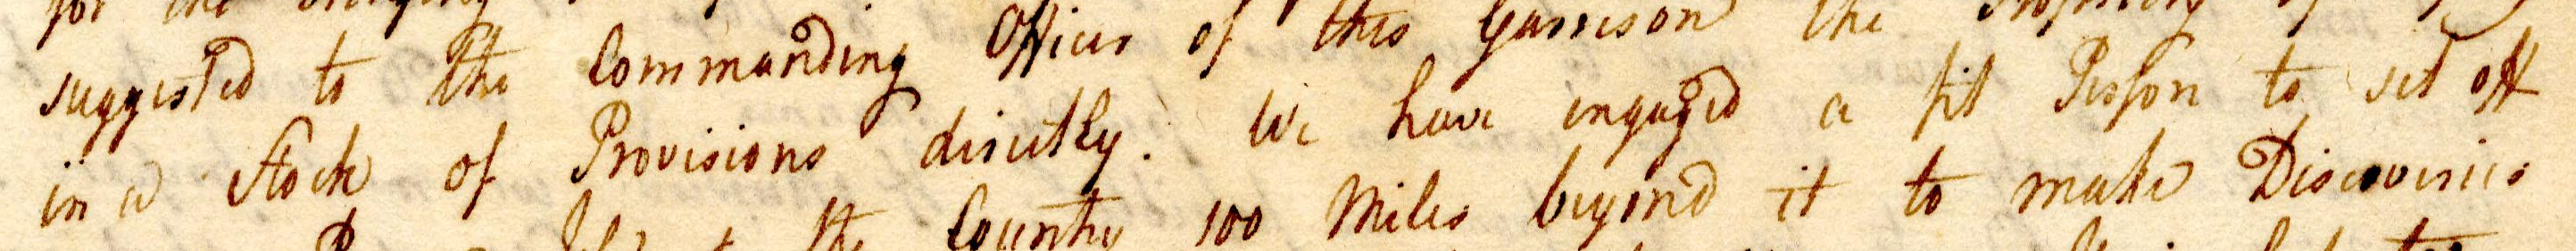in a Stock of Provisions directly. We have engaged a fit Person to set off
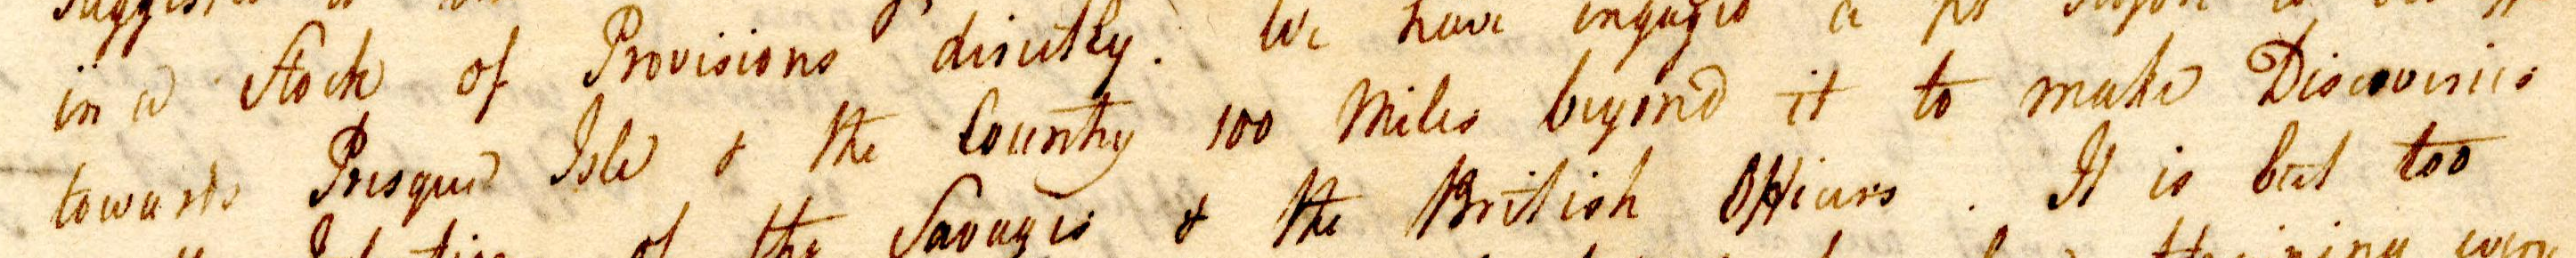towards Presque Isle & the Country 100 miles beyond it to make Discoveries
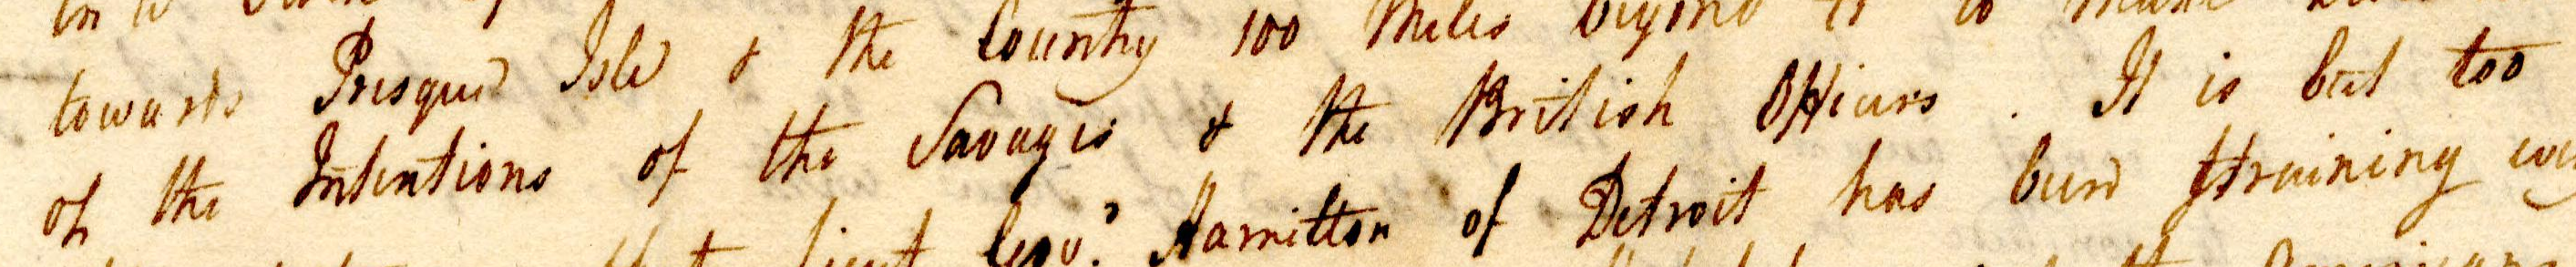of the Intentions of the Savages & the British Officers. It is but too
